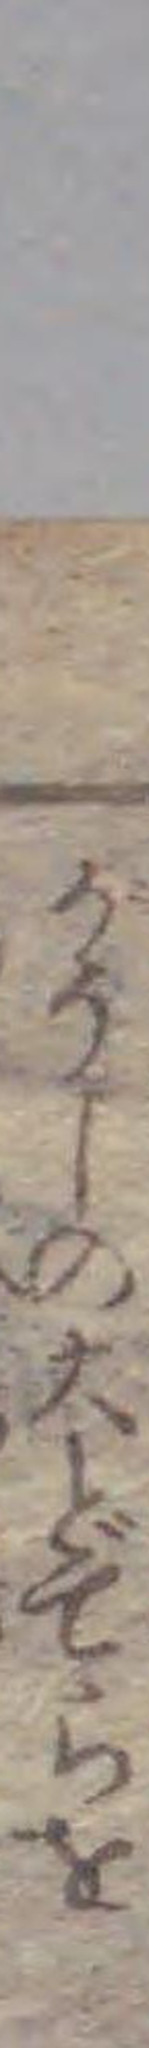がうしの大どてらを
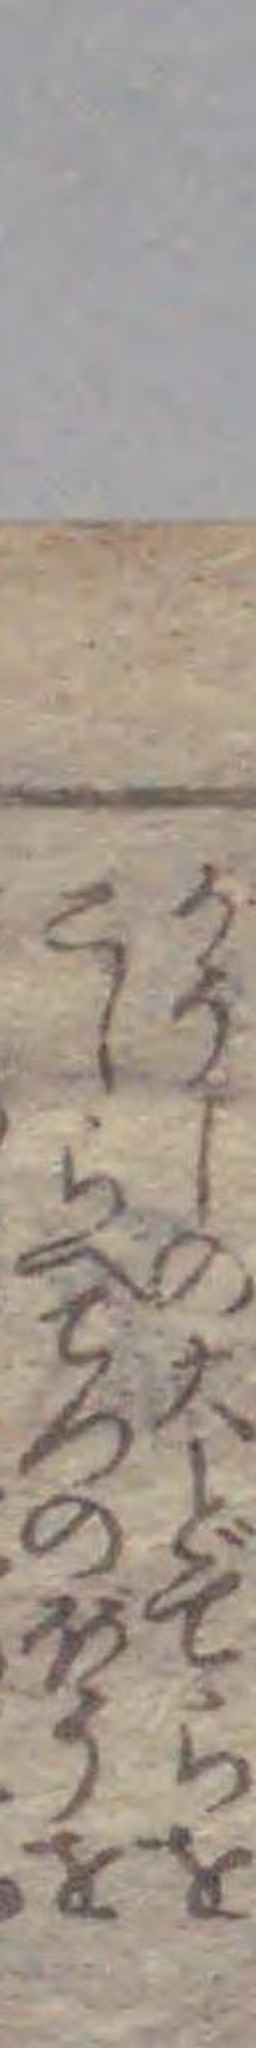こしらへてつのぼうを
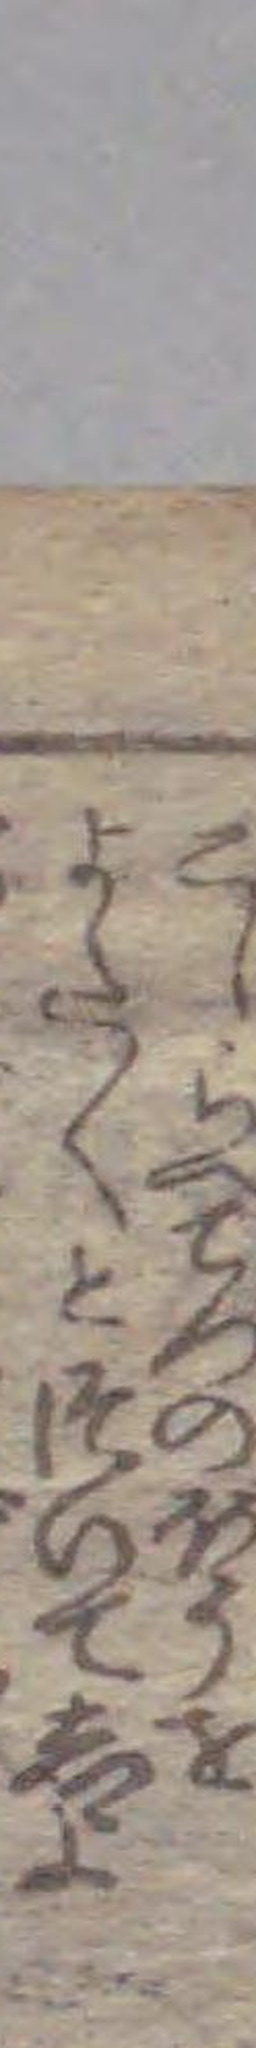よた〳〵とついてしよ
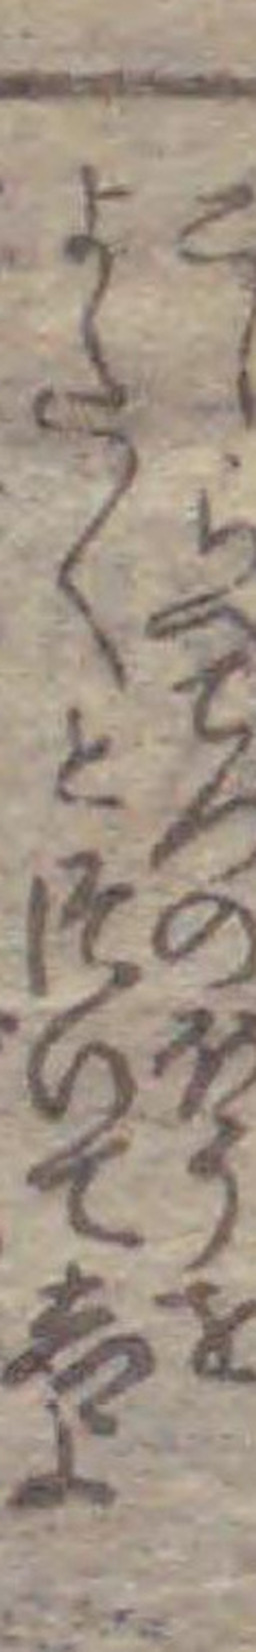よた〳〵とついてしよ
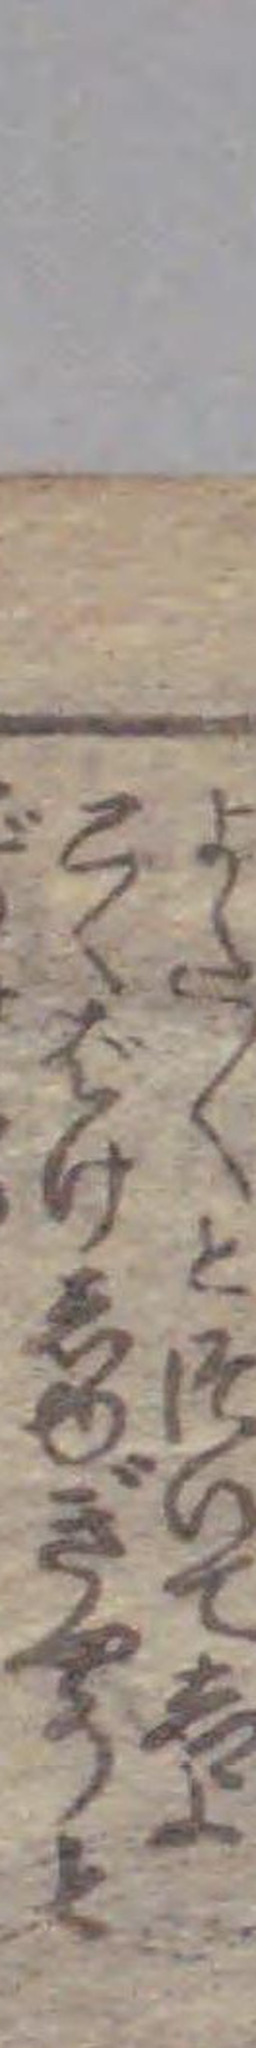こくばけしゆぎやうと
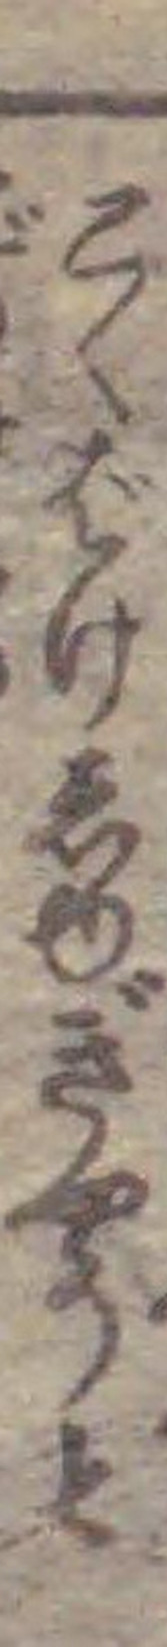こくばけしゆぎやうと
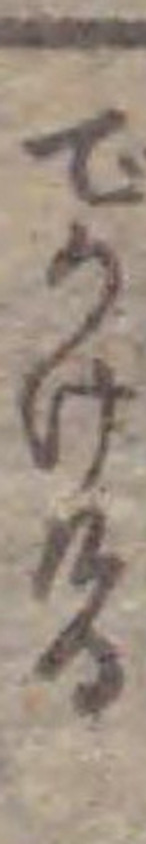でかけける
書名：[大昔化物双紙] : 2巻
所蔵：国立国会図書館 National Diet Library, JAPAN
